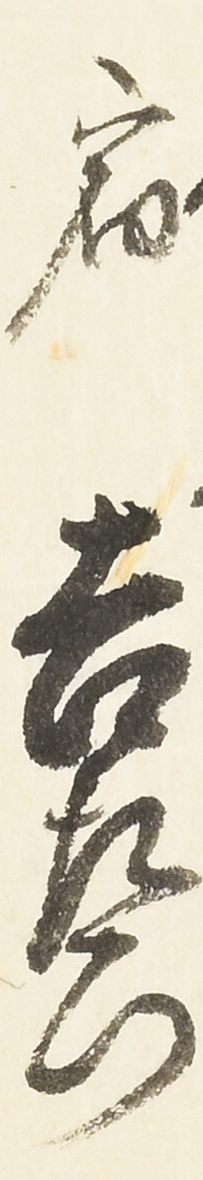宿吉左衛門
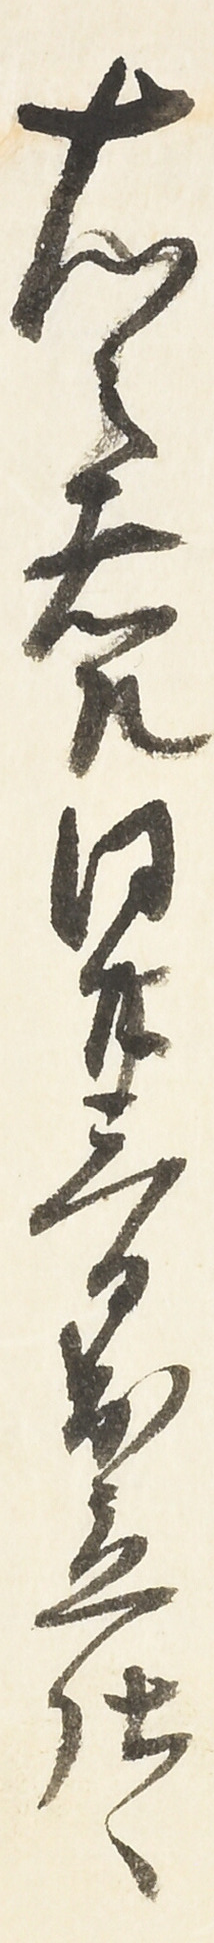右之者共同廿三日出立仕候
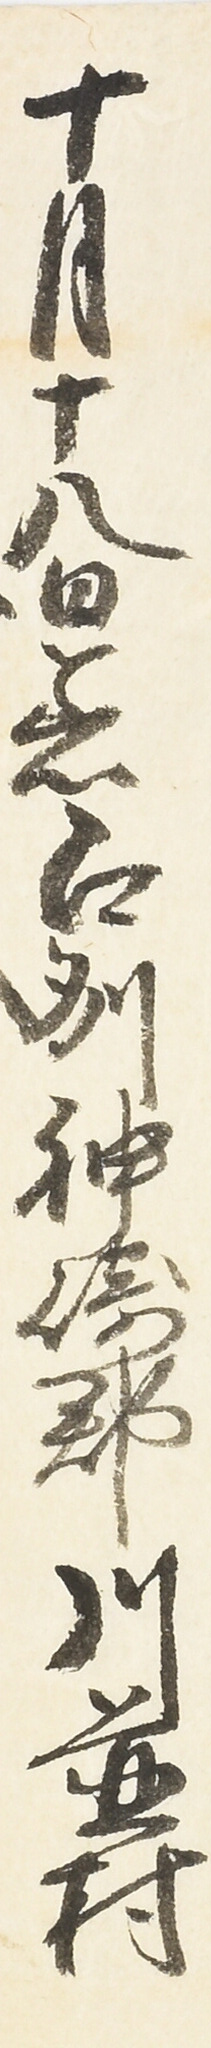十月十八日着江州神崎郡川並村
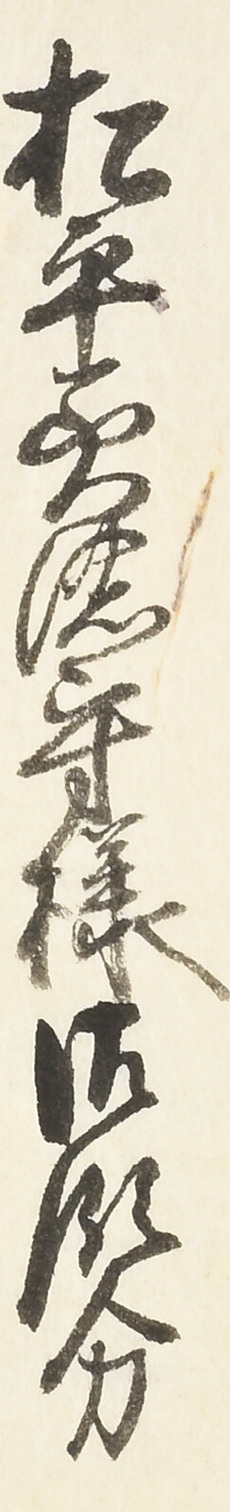松平美濃守様御領分
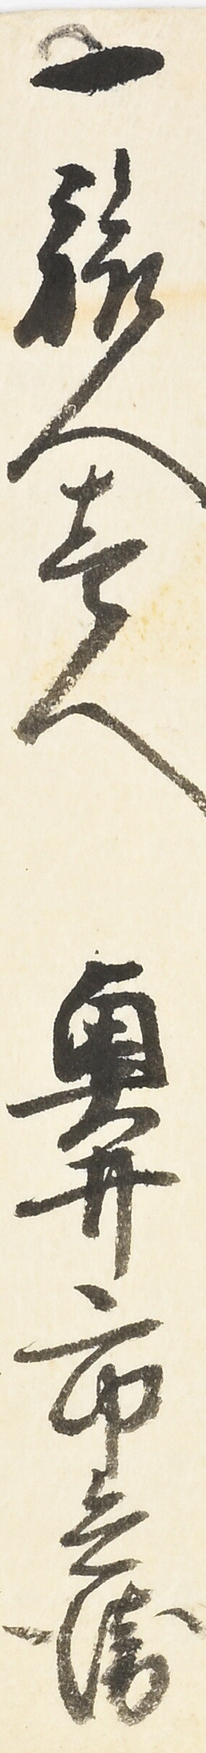一旅人壱人奥井市兵衛
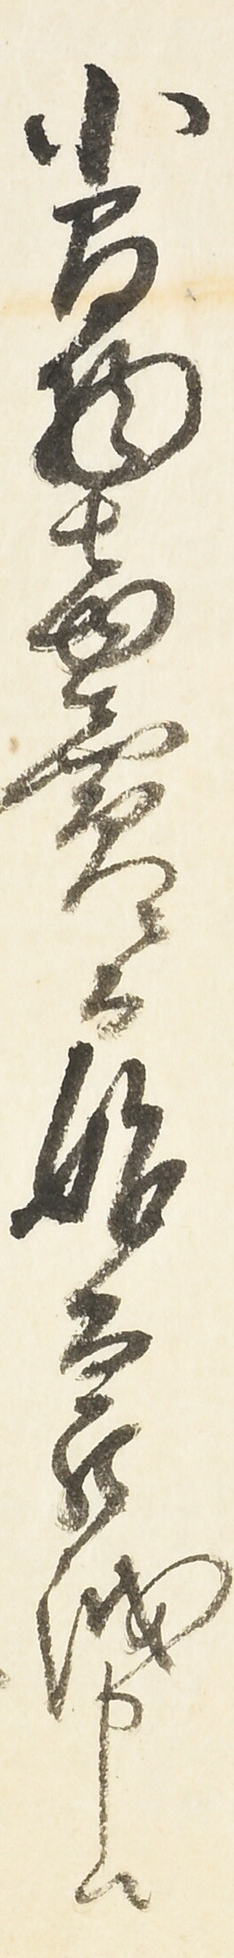小間物商売ニ而始而罷越申候
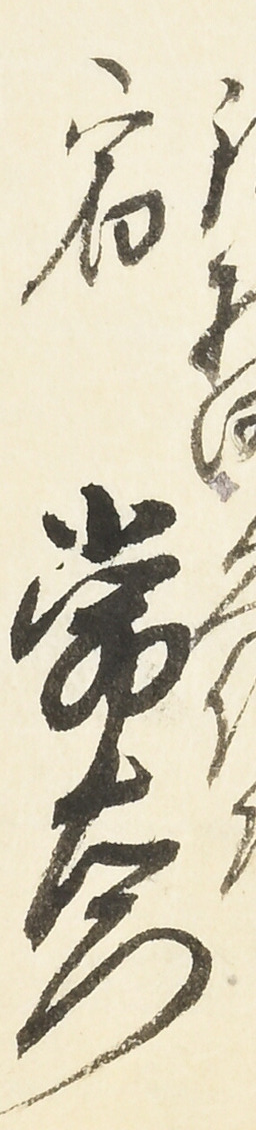宿常右衛門
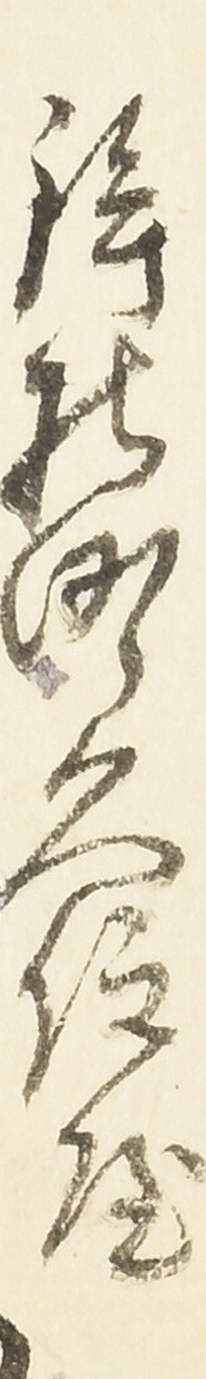鉾持町久住屋
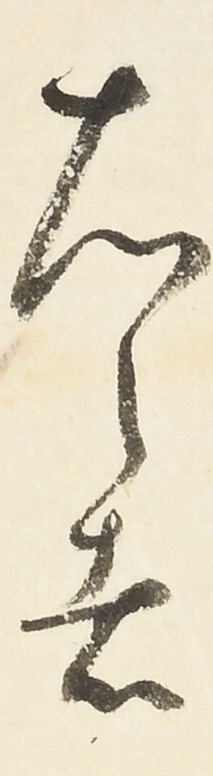右之者
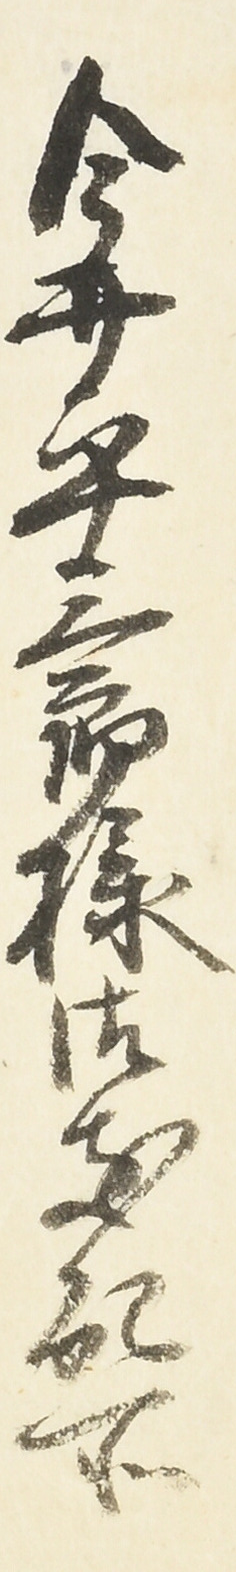今井平三郎様御支配所
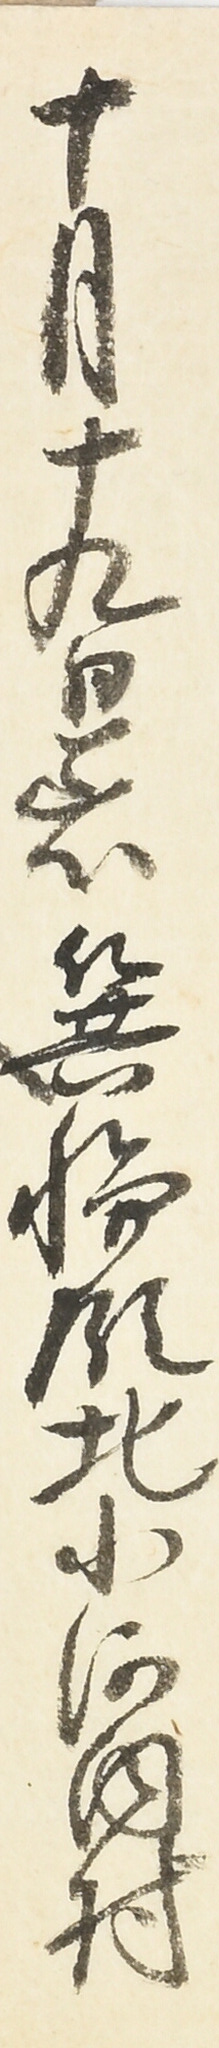十月十九日着箕輪領北小河内村
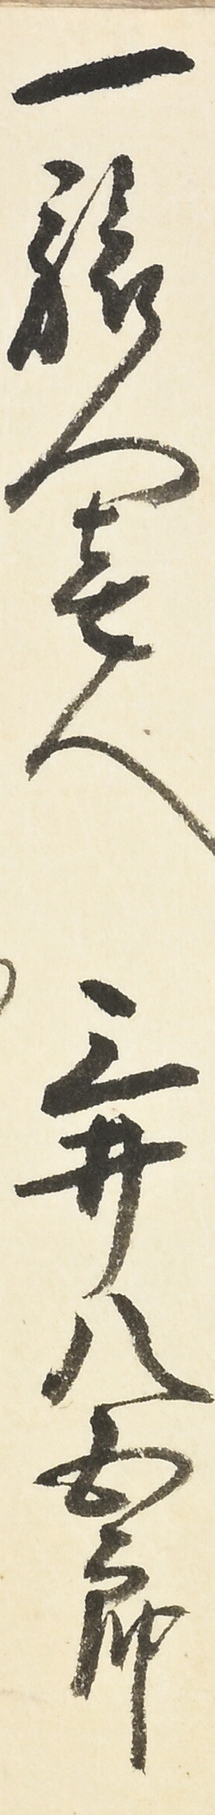一旅人壱人三井八五郎
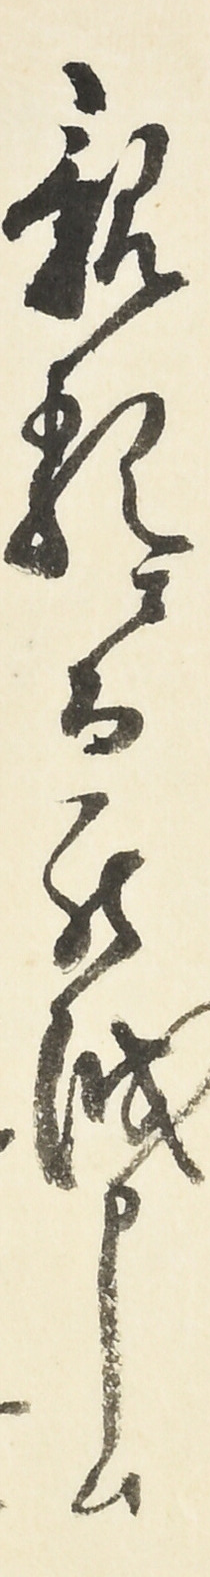親類ニ而罷越申候
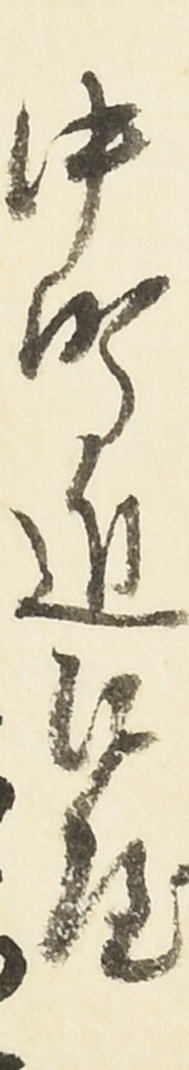中町近江屋
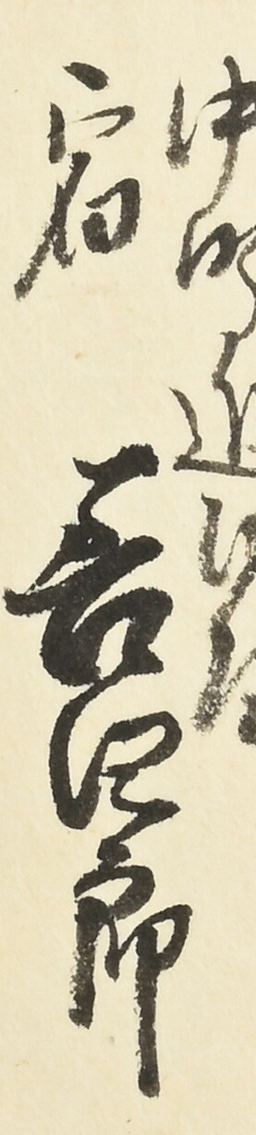宿善四郎
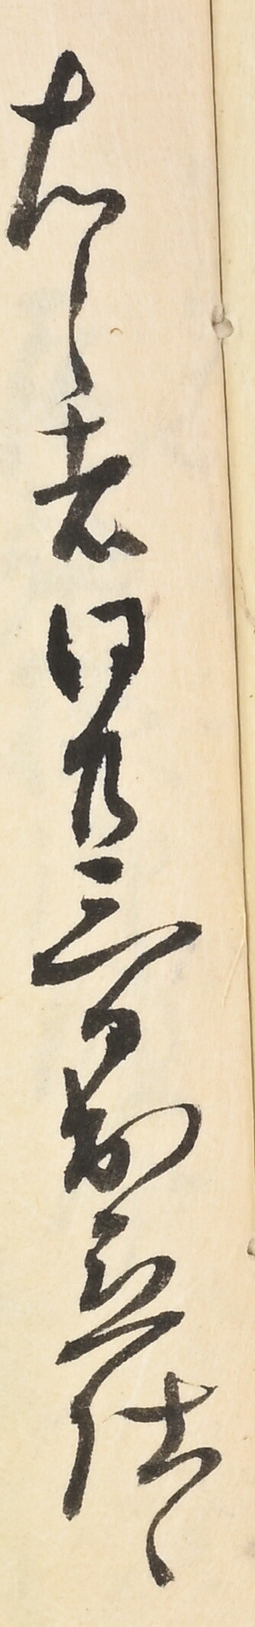右之者共同廿三日出立仕候
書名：町中旅人泊控帳
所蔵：伊那市立高遠町図書館・合同会社AMANE
